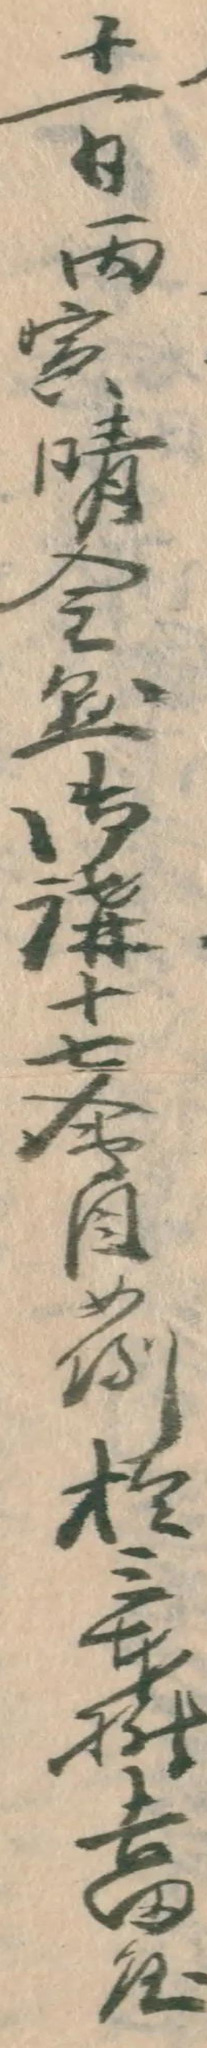十一日丙寅晴金懸御講十七會目如例於三本掛吉田屋
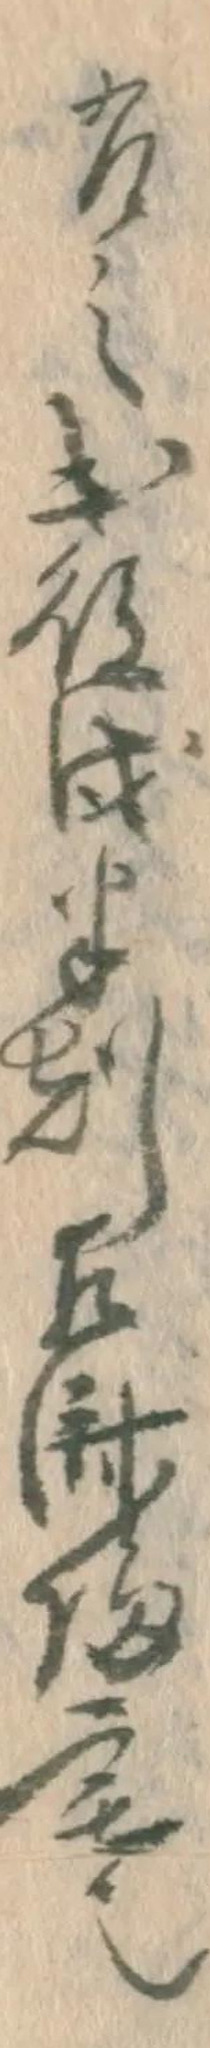有之出役戌半刻相済帰宅也
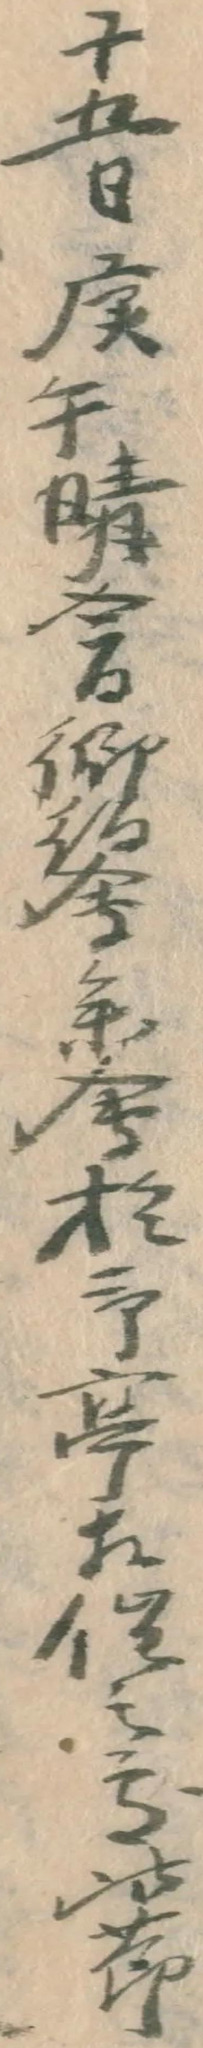十五日庚午晴五日郷約會参會於予亭相催之處此節
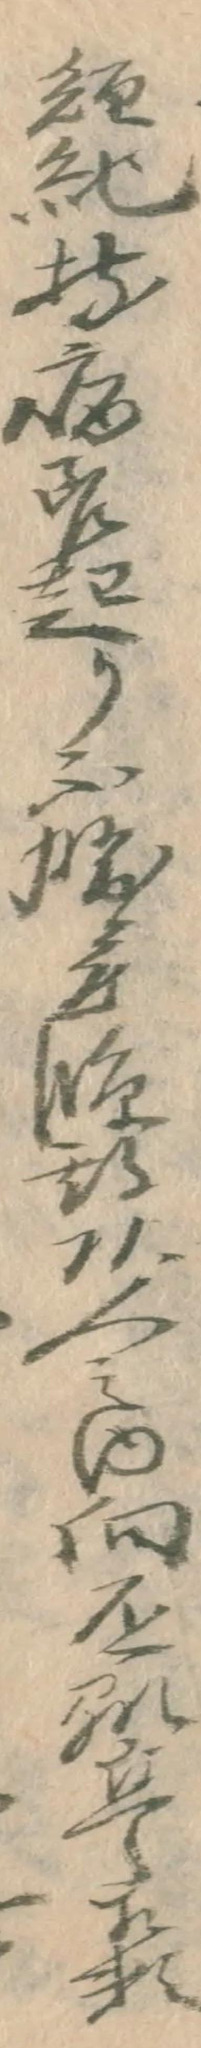経紀持病差起リ不勝ニ付臨期頭人之内向丕顕亭相頼
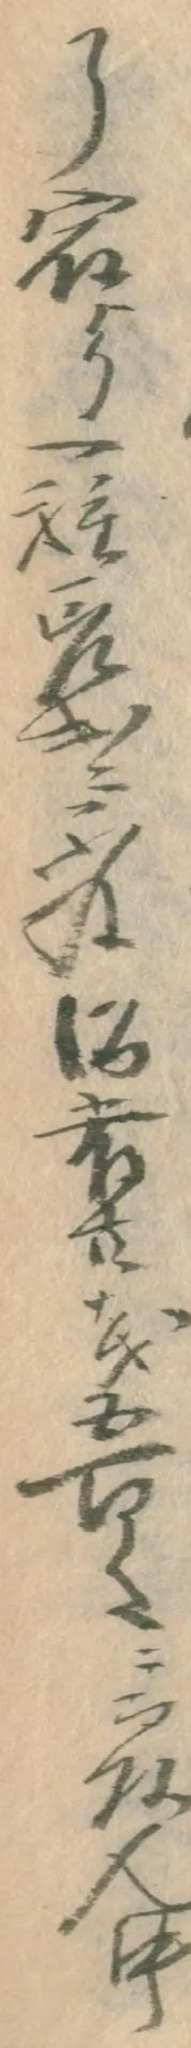了宿より一種差出ニ不及酒肴共も五百文ニ而頭人中

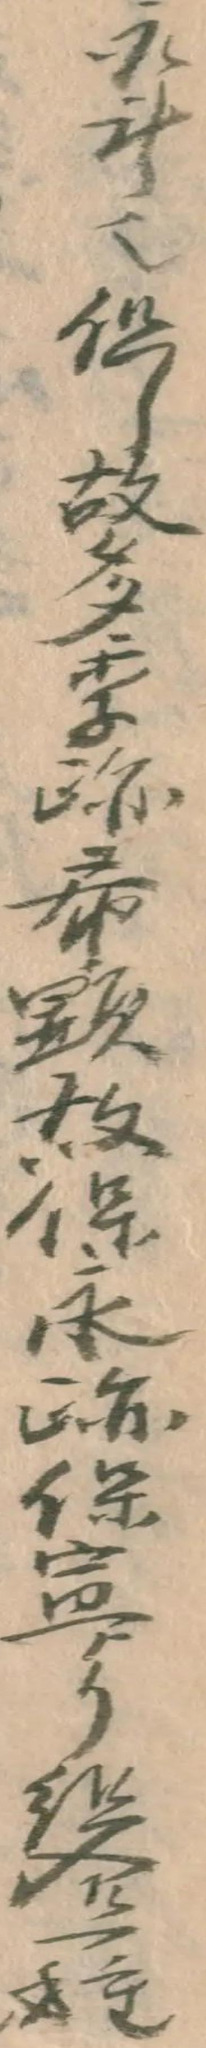取斗也但し故多季跡希顕故保永跡保宣より組合一種
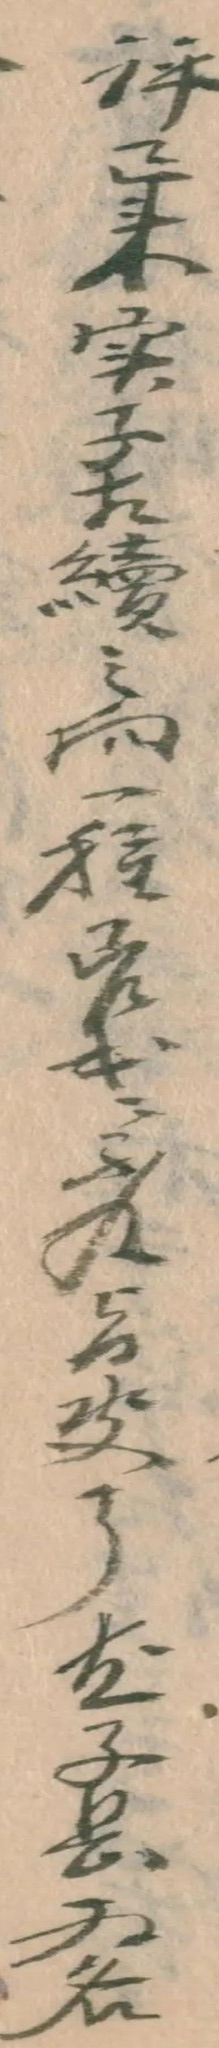評已来実子相續之向一種差出ニ不及旨決了尤子息為名
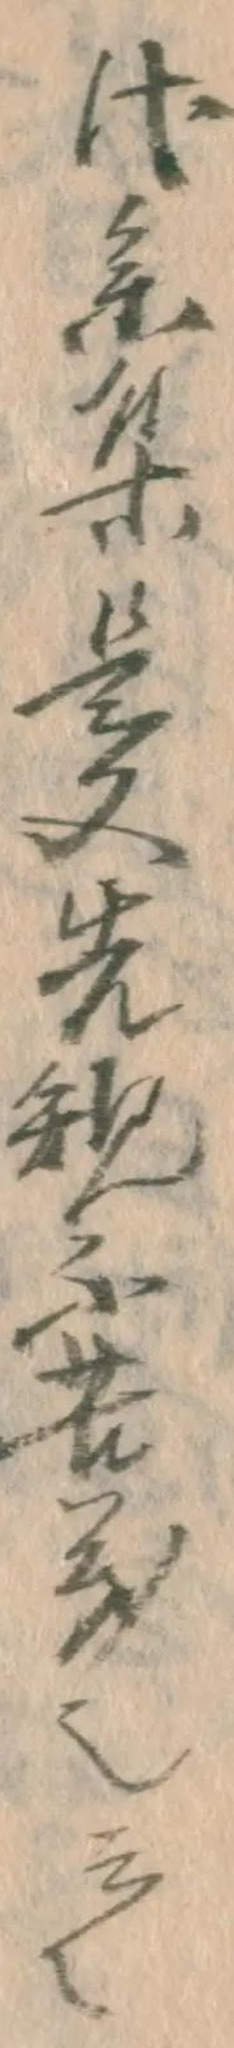代参集是又先規不苦義也云々
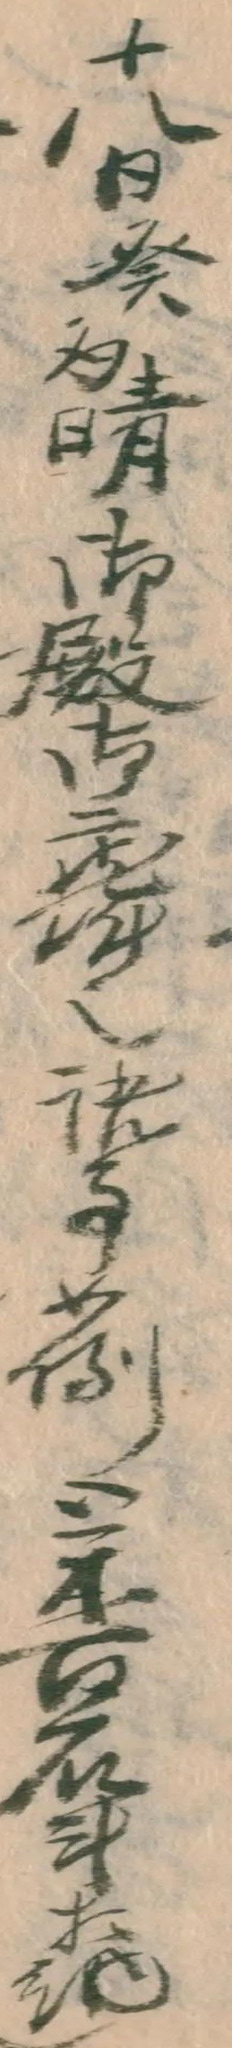十八日癸卯晴御殿御蔵也諸事如例御米百石斗相納也
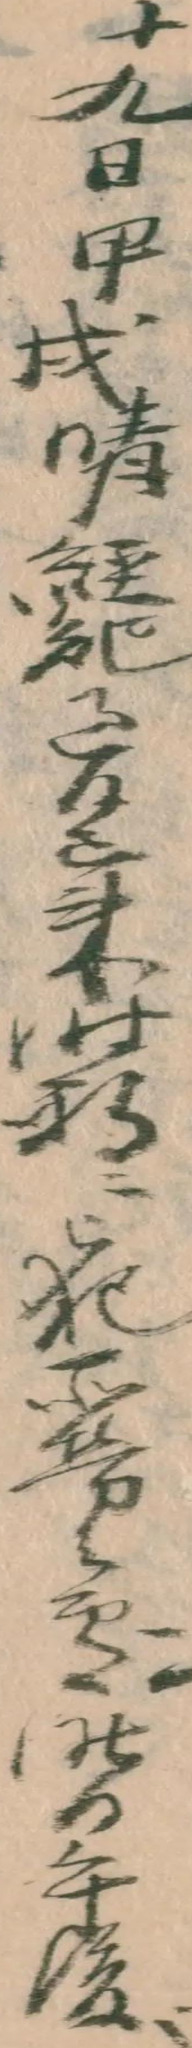十九日甲戌晴経記過日已来時折ニ被犯所労之處昨日午後
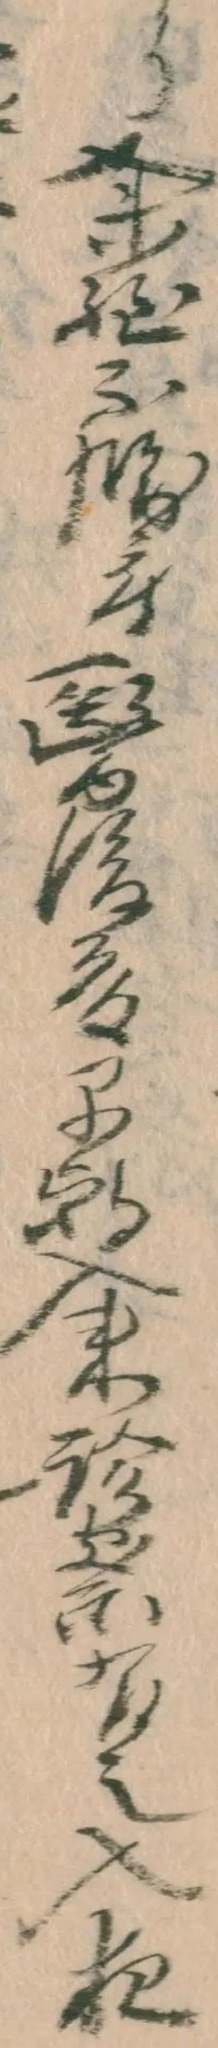余程不勝ニ付醫院後藤早朝入来診察有之入夜
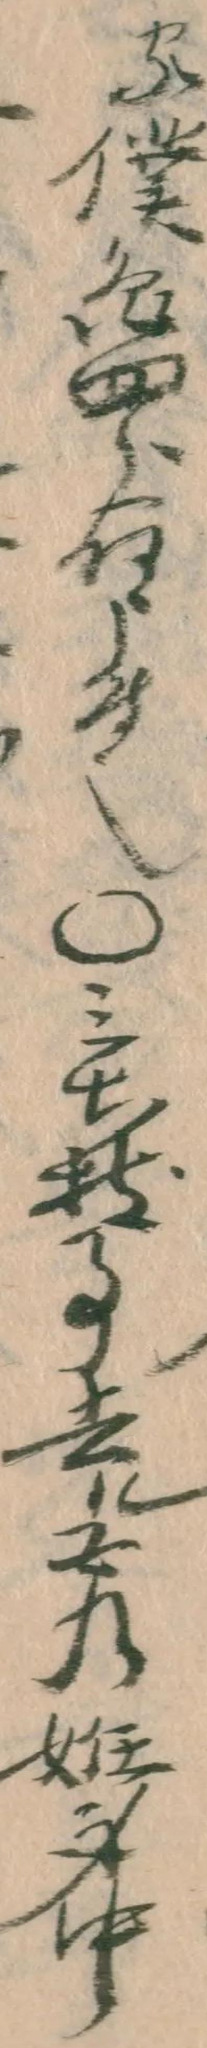家僕亀四郎有申付也○ミち枝事去ル五月妊身中
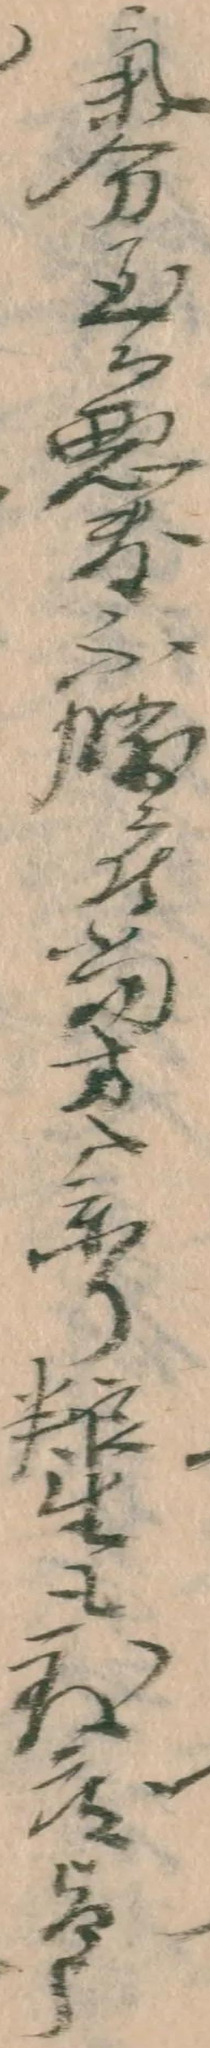氣分至而悪敷不勝ニ付當方へ参り粮生も致度旨申
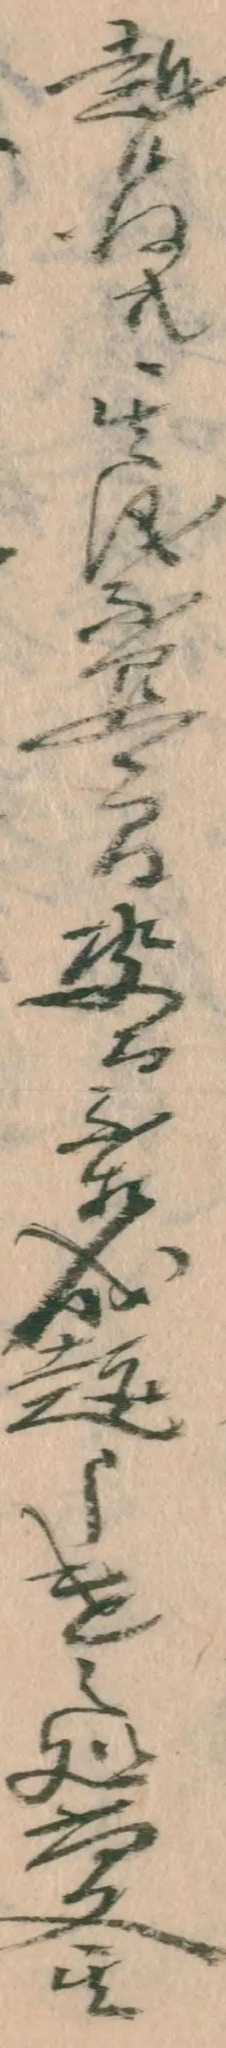越候得共其儀不宜候間決而不相成趣申遣候処尚又其
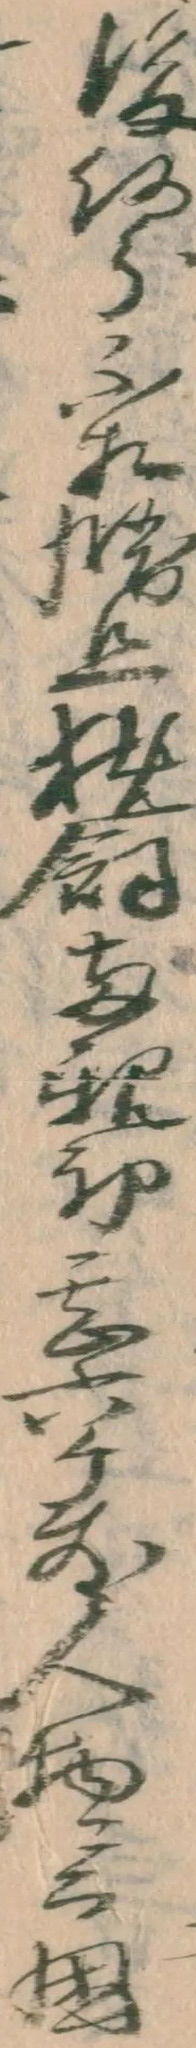後何分不相勝且猪飼両親初甚六ケ敷人物ニ而困
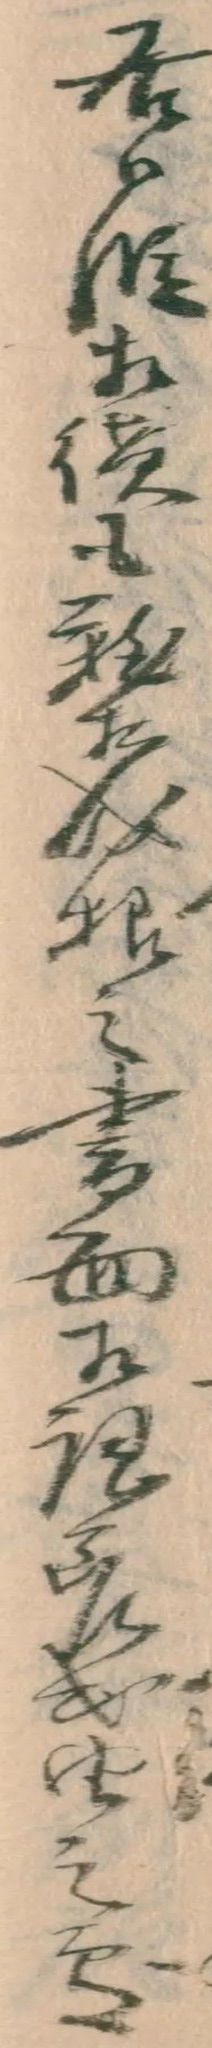居候段相續も難相成様之書面相認差出由之處
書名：賀茂社記録. 第67冊
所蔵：国立国会図書館 National Diet Library, JAPAN
